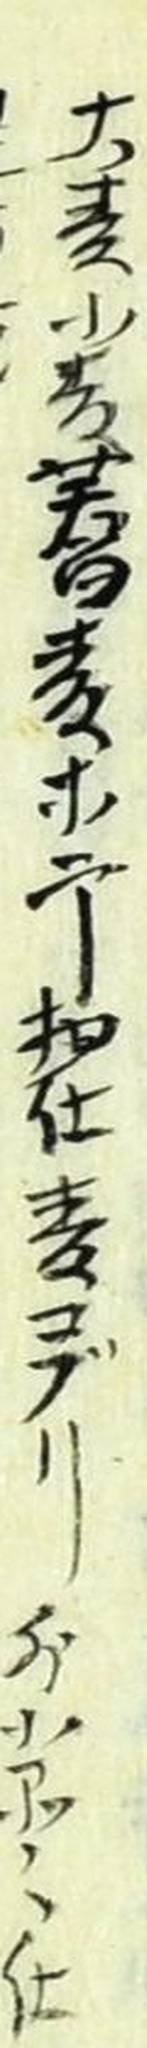大麦小麦蕎麦等干控仕麦コブリ外小品々仕
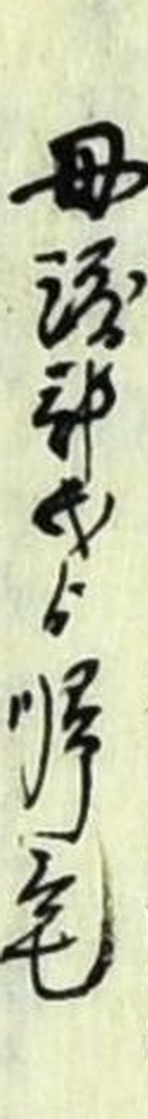母渡部氏ゟ帰宅
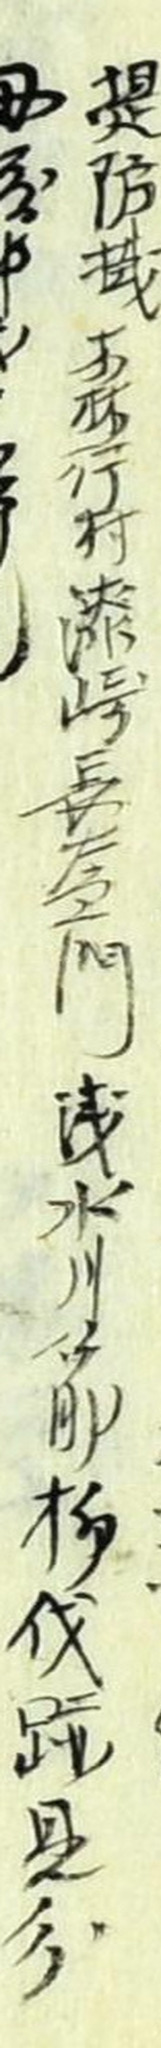堤防掛森行村漆崎長左ヱ門浅水川筋柳伐跡見分
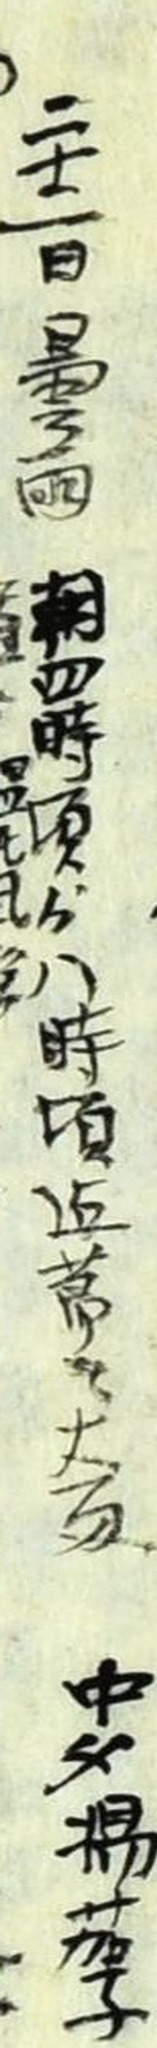○二十二日曇雨朝四時頃ゟ八時頃迄節々大雨中夕揚茄子
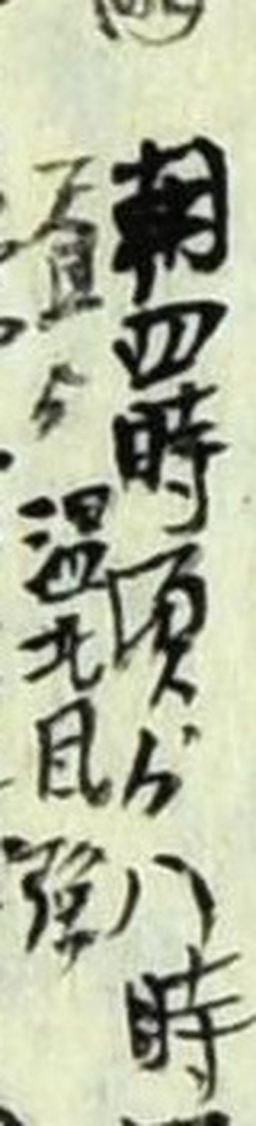昼ゟ温北風強
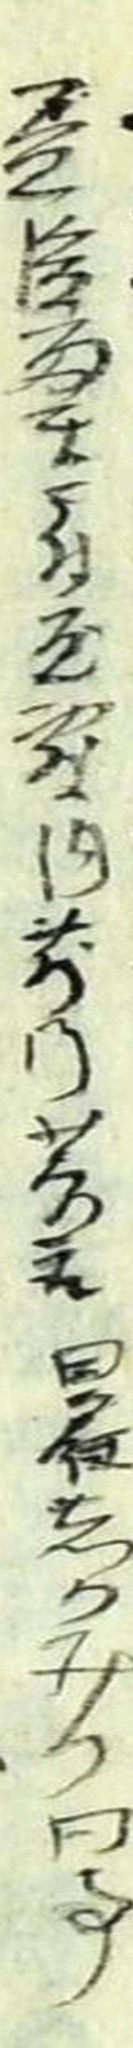昼後雨天ニ付屋敷内前門草取日雇しかみつ同事
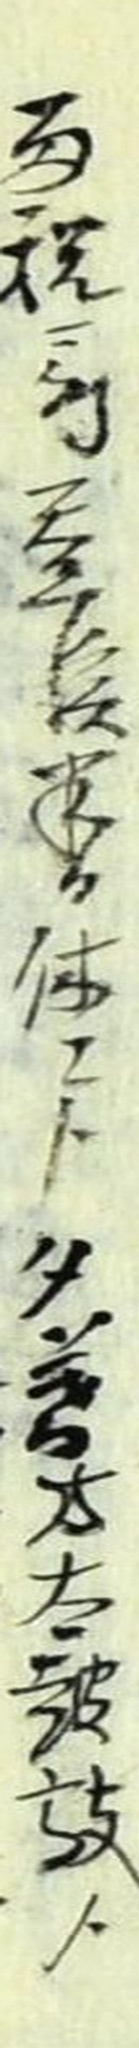雨祝ニ付昼後半日休ニ候夕暮方太鼓敲候
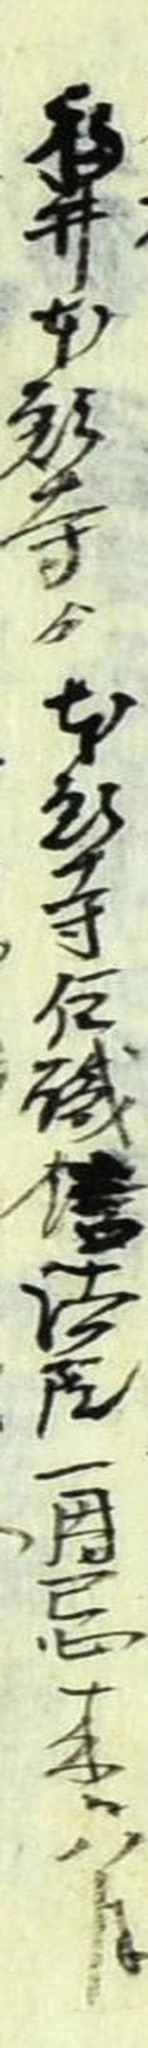福井本願寺ゟ本願寺住職信法院一周忌来ル八月
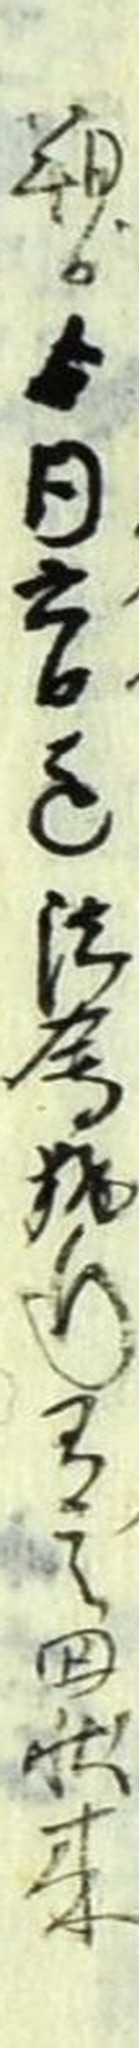朔日ゟ同六日迄法会執行有之回状来

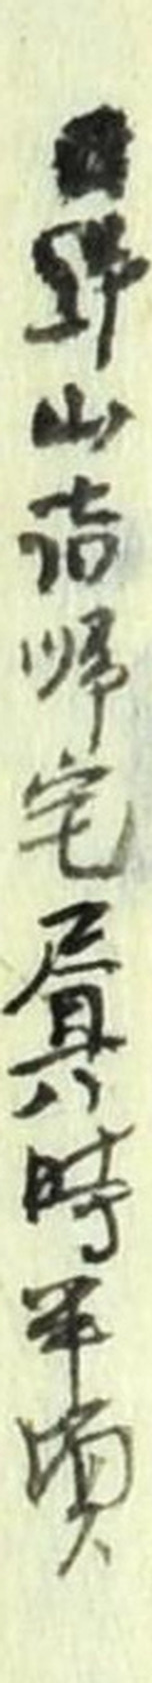日野山詣帰宅昼八時半頃
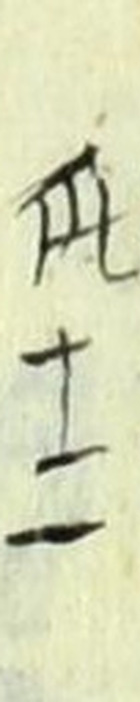瓜十」
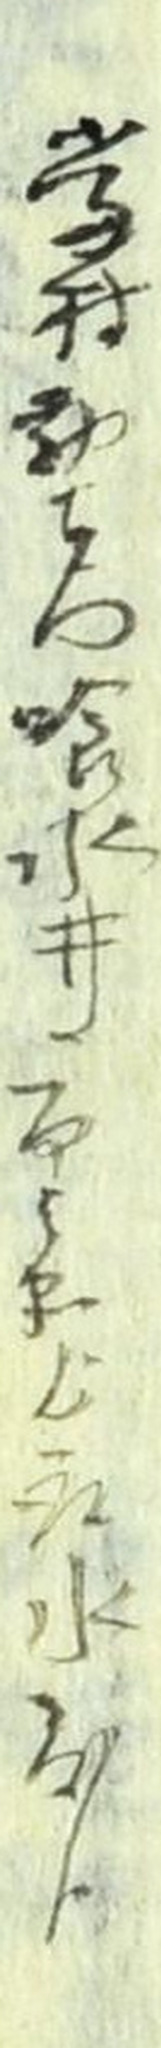当村勘右衛門喰水井市兵衛ゟ取水致候
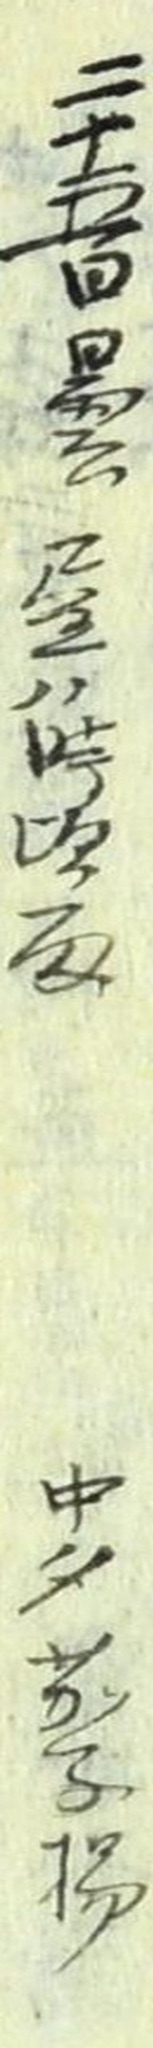二十五日曇昼八時頃雨中夕茄子揚
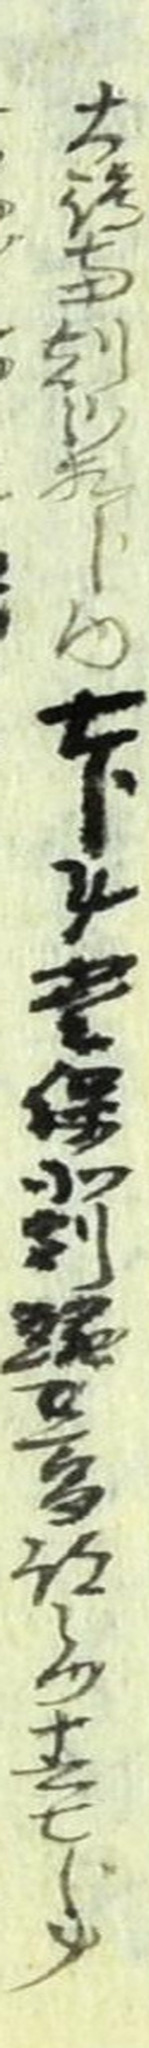大島南割弐拾歩内七歩計堂保北割豌豆畠跡之内十六七歩計
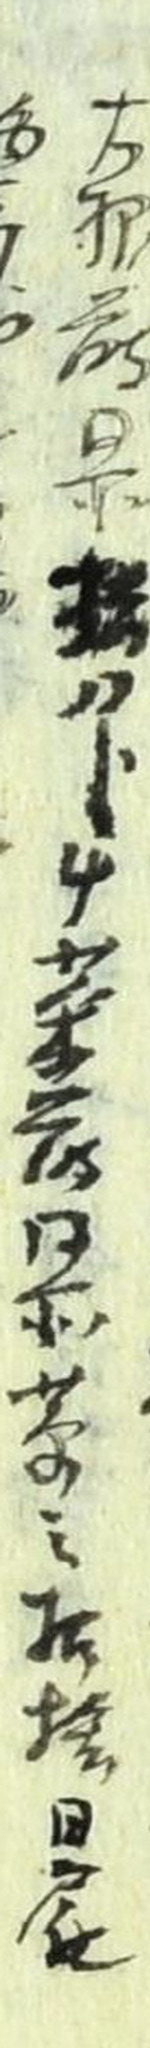大根蒔同所拾八歩計菜蒔同所草之根捨日雇
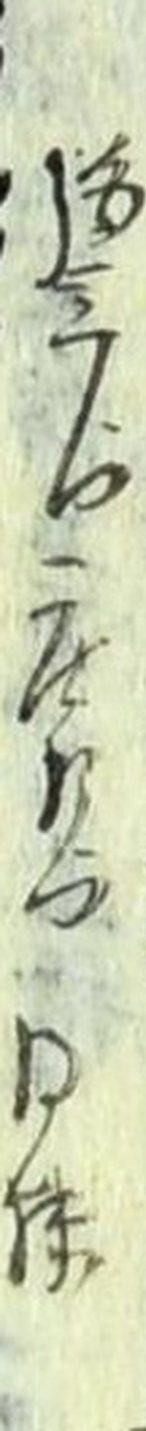弥三右衛門庄左衛門同様
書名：（日記）
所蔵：福井県文書館 Fukui Prefectural Archives
